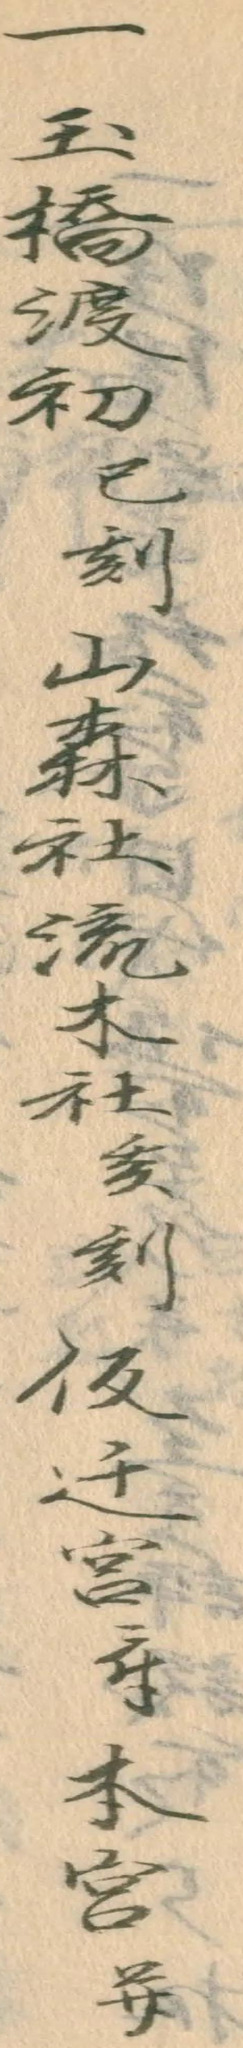一玉橋渡初巳刻山森社流木社亥刻仮迁宮ニ付本宮并
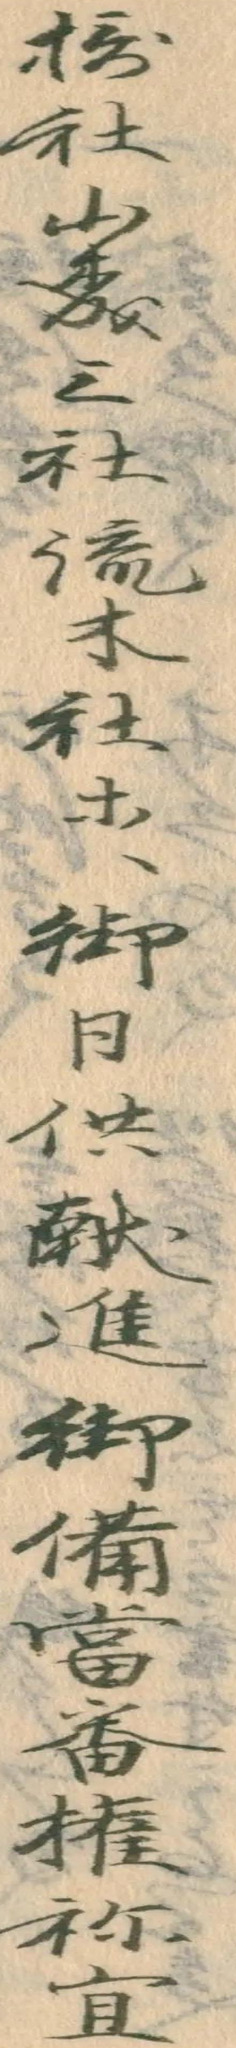摂社山森三社流木社等へ御日供献進御備当番権祢宜
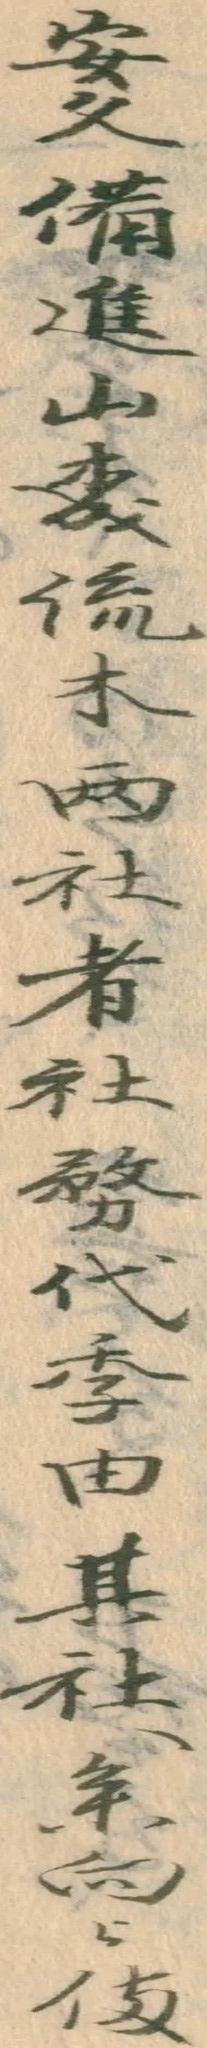安久備進山森流木両社者社務代季由其社へ参向被備
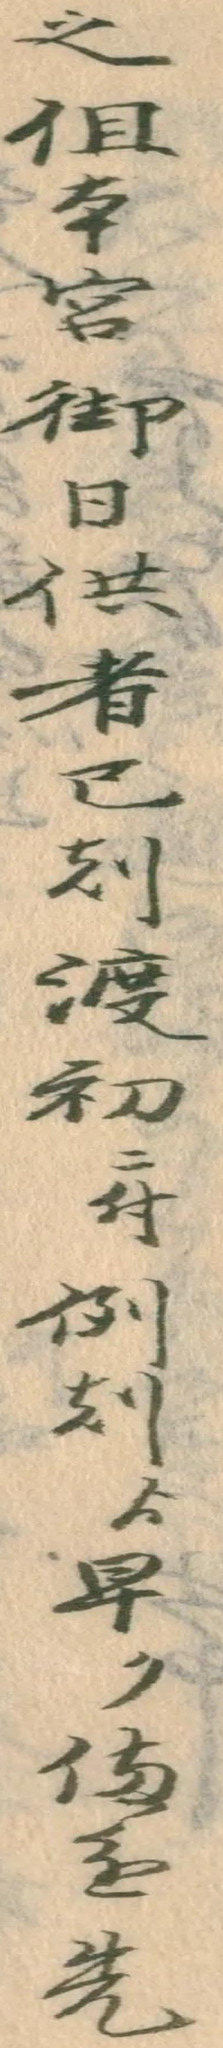之但本宮御日供は巳刻渡初ニ付例刻ゟ早ク備進先
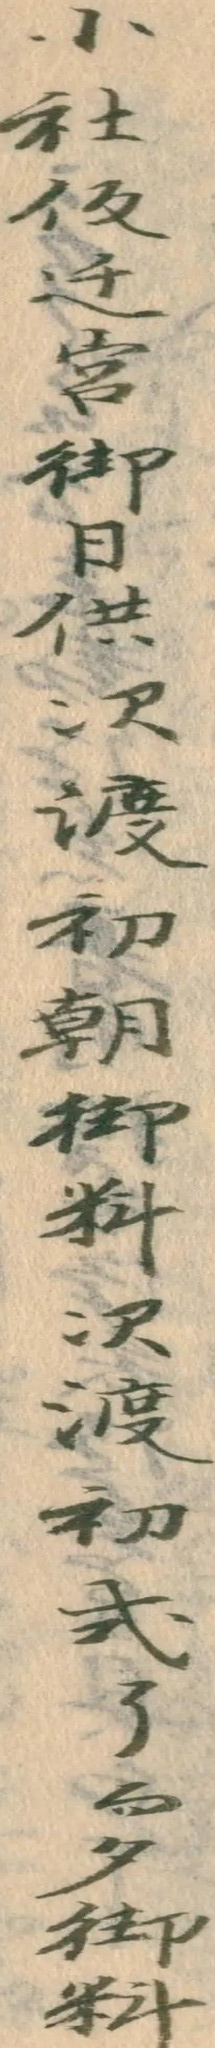小社仮迁宮御日供次渡初朝御料次渡初式了而夕御料
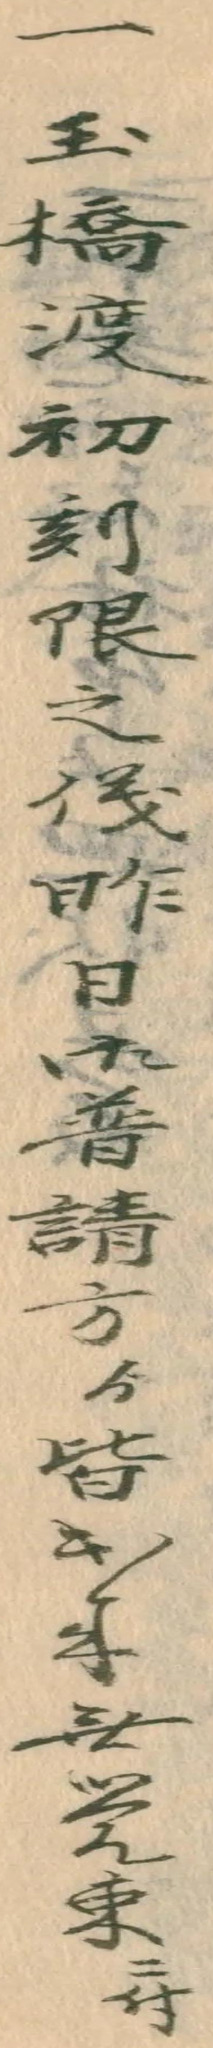一玉橋渡初刻限之儀昨日御普請方ゟ皆出来無覚束ニ付
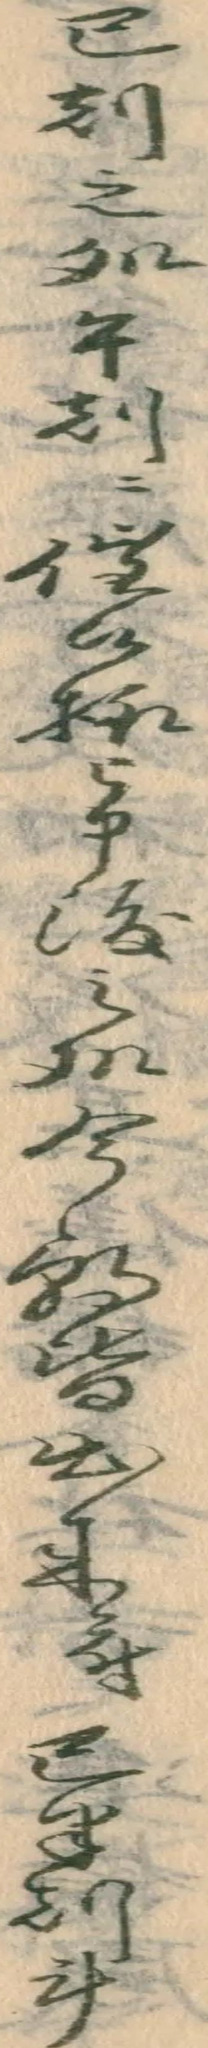巳刻之処午刻ニ催候様被申渡之処今朝皆出来ニ付巳半刻計
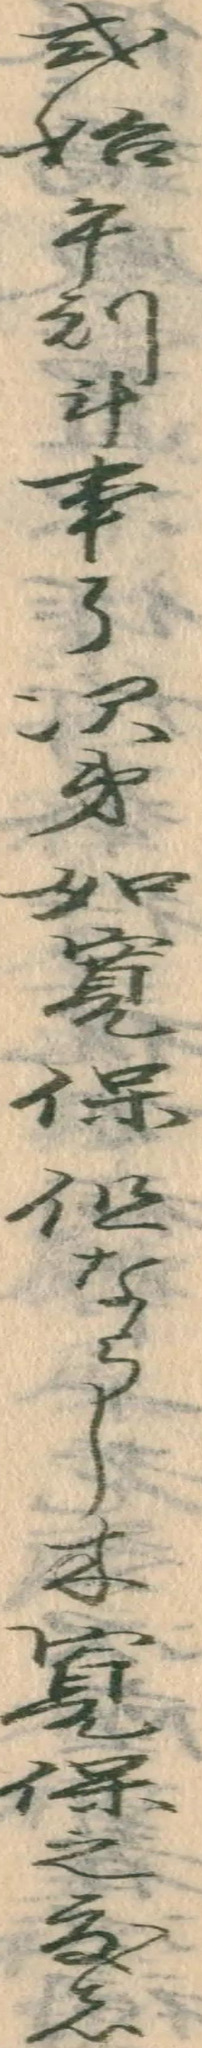式始午刻計事了次第如寛保但ならし木寛保之度は
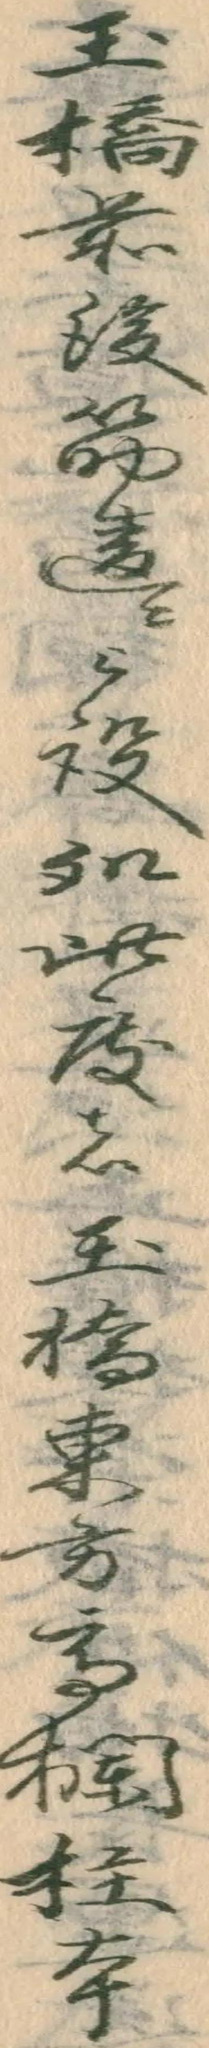玉橋前後筋違ニ被設処此度者玉橋東方高欄柱本
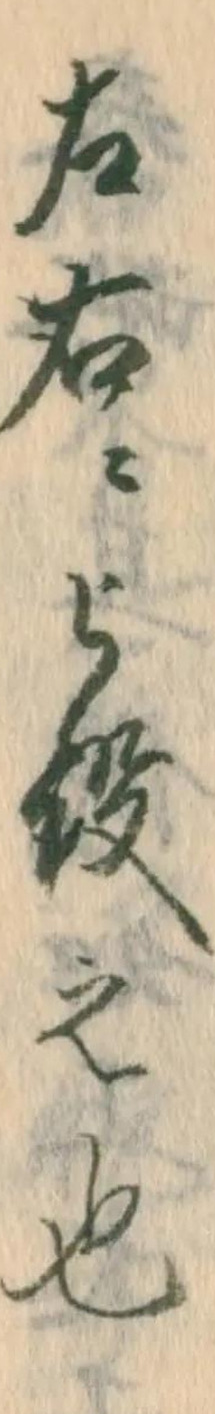左右ニ被設之也
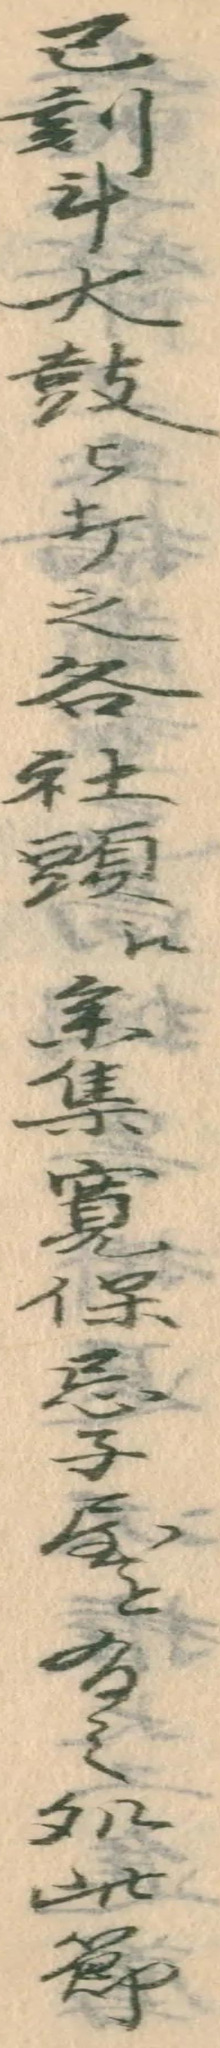巳刻計大鼓被打之各社頭江参集寛保忌子屋と有之処此節
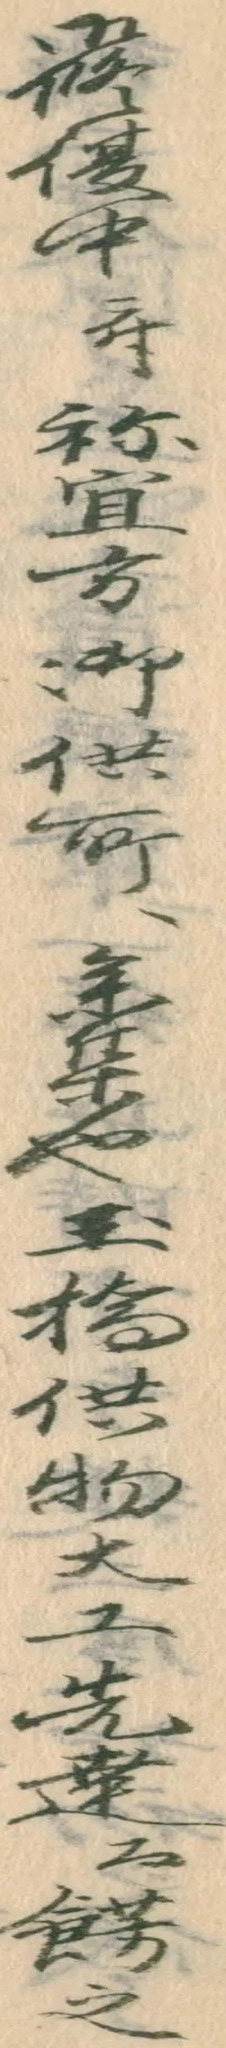御修復中ニ付祢宜方御供所へ参集也玉橋供物大工先達而錺之
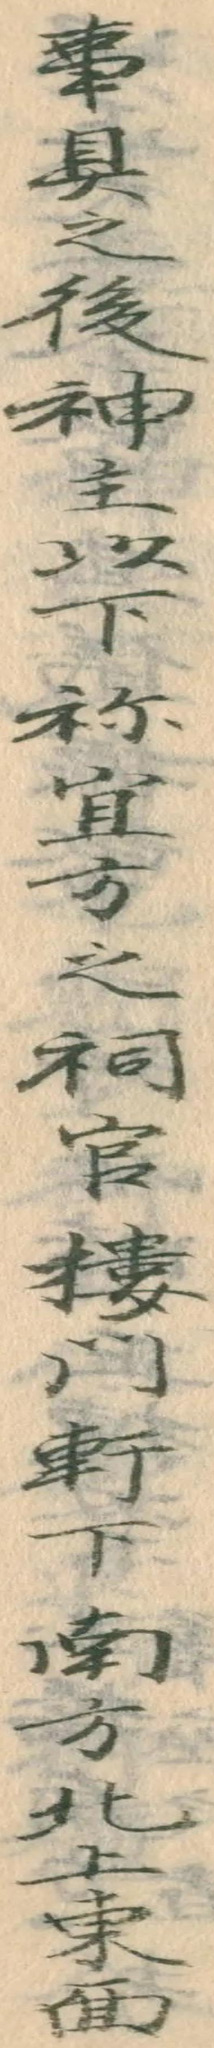事具之後神主以下祢宜方之祠官楼門軒下南方北上東面
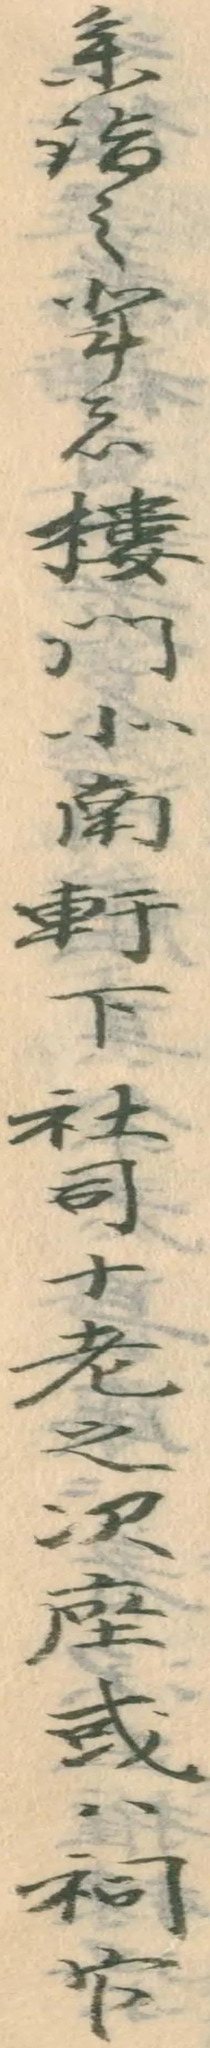参詣之輩は楼門北南軒下社司十老之次座或ハ祠官

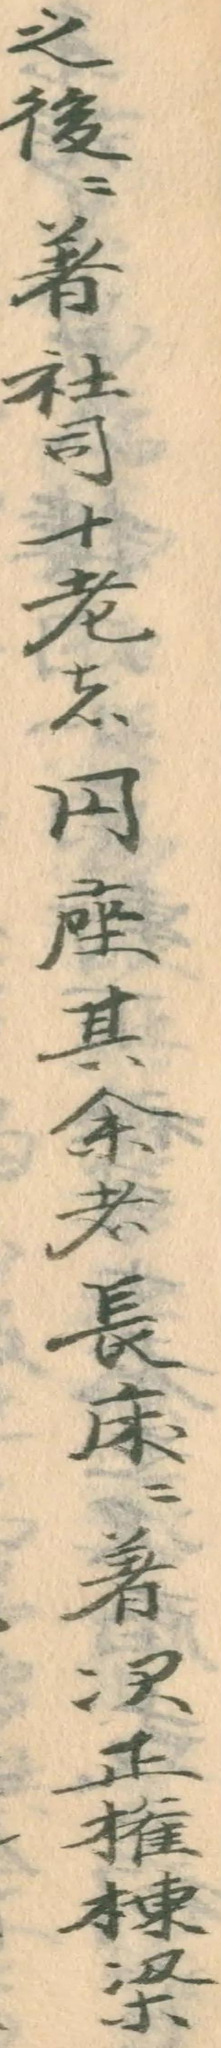之後ニ着社司十老は円座其余は長床ニ着次正権棟梁
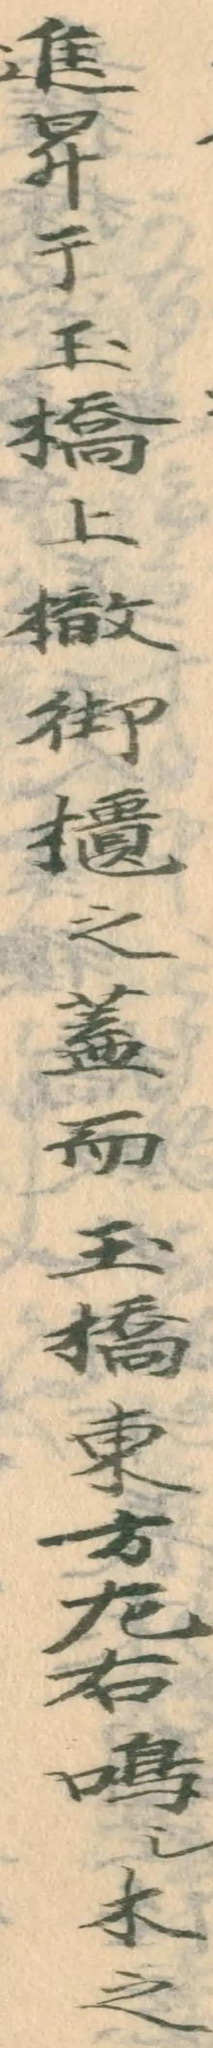進昇于玉橋上撤御之蓋而玉橋東方左右鳴シ木之
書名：賀茂社記録. 第17冊
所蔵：国立国会図書館 National Diet Library, JAPAN
